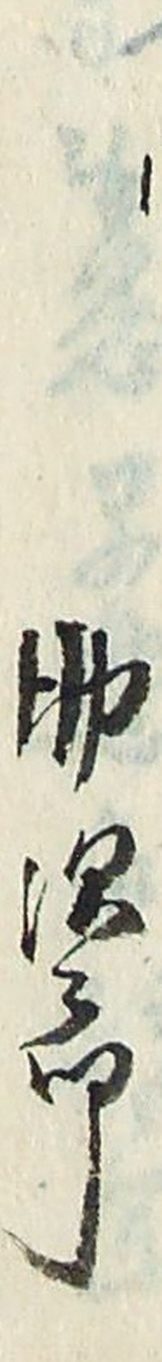助次郎
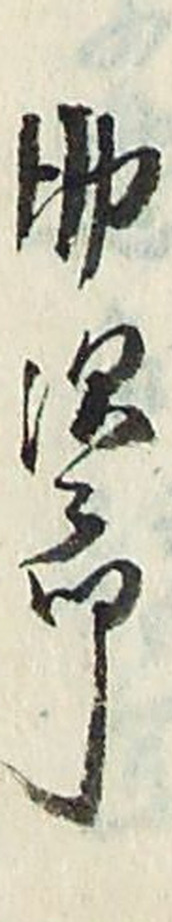助次郎
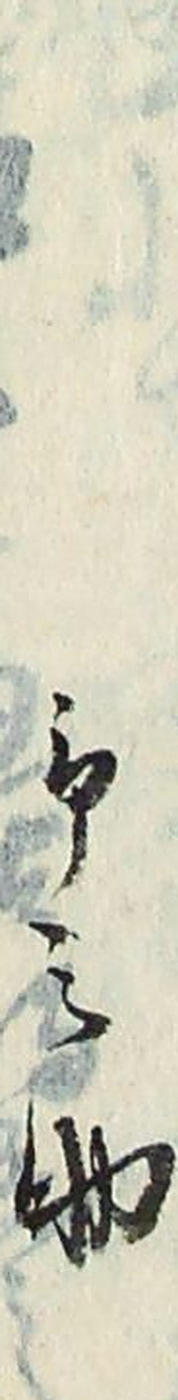市之助
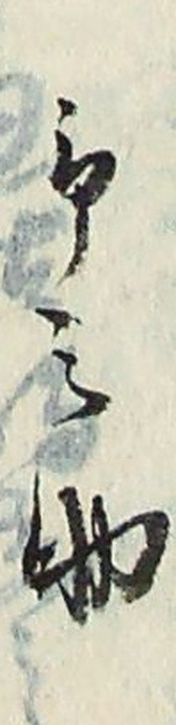市之助
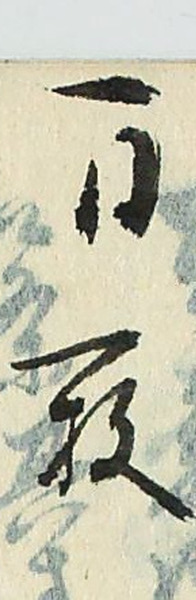一同一枚同
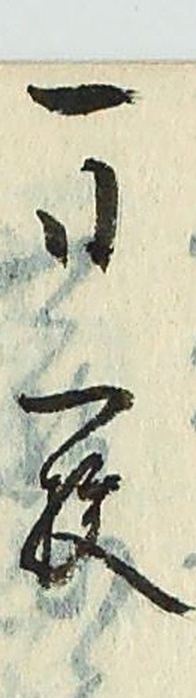一同一枚同
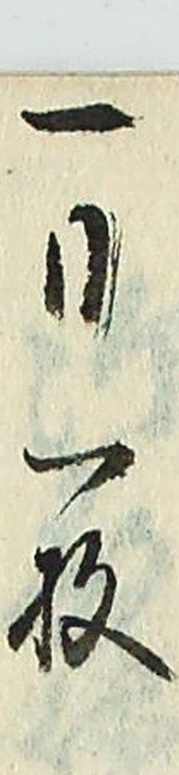一同一枚同
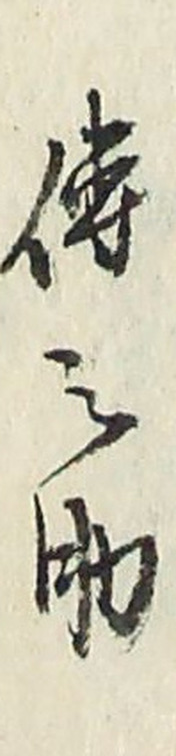市之助
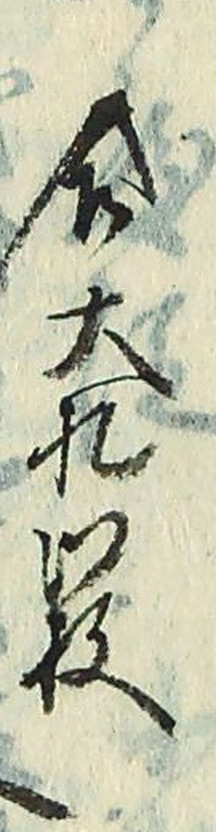合大札弐枚
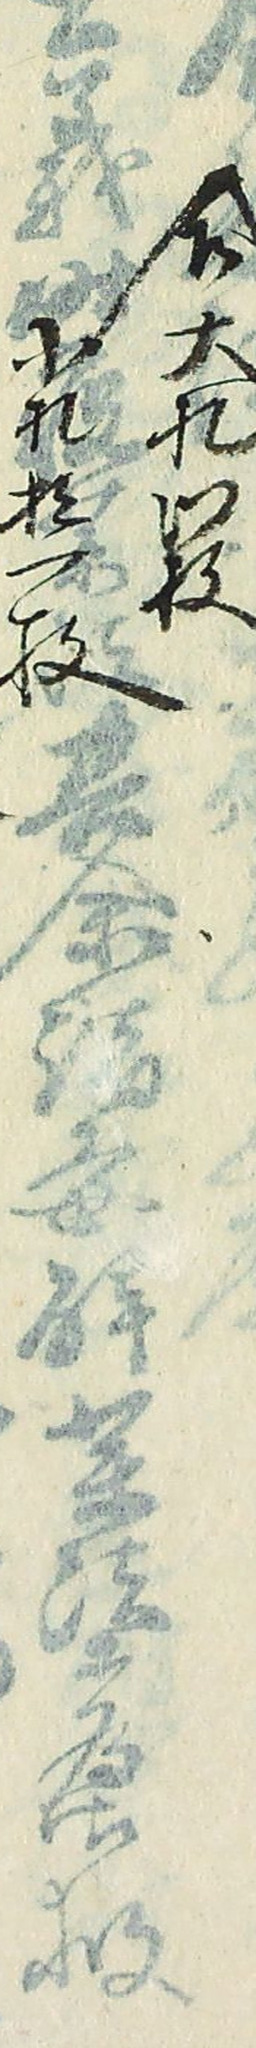小札拾一枚
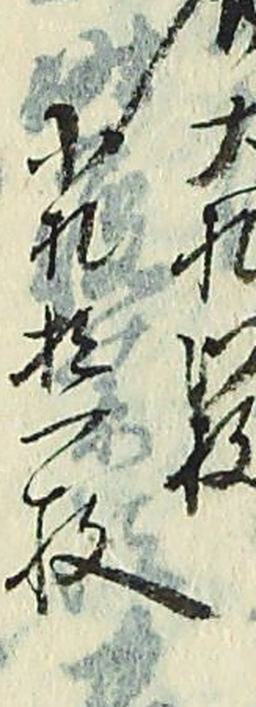小札拾一枚
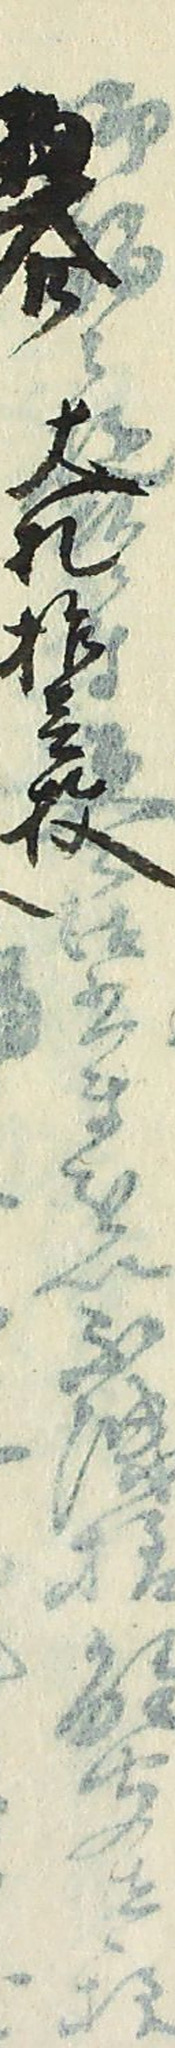惣合大札拾壱枚
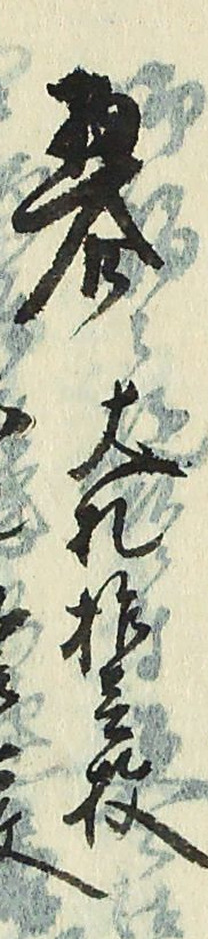惣合大札拾壱枚
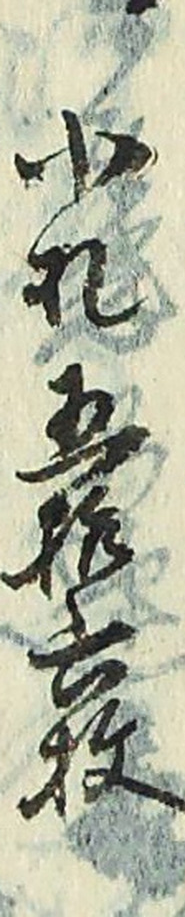小札五拾六枚
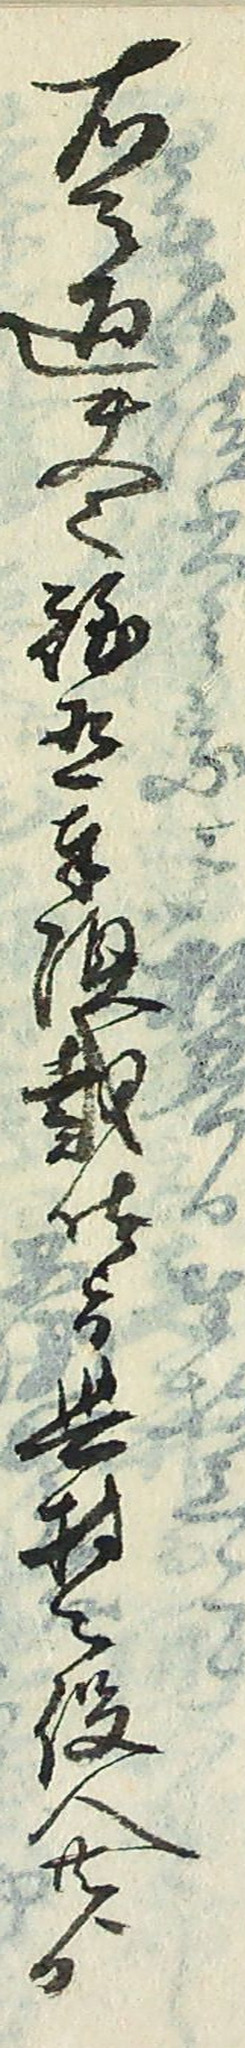右之通夫々難有奉頂戴仕候旨与村々役人共ゟ
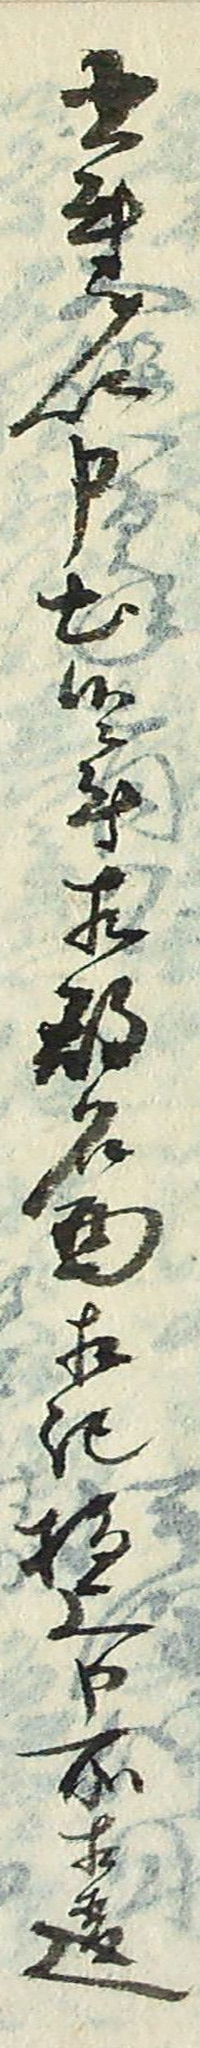書付を以申出候に付相都名面相記指上申所相違
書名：諸御用御□受書控
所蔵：鳴門教育大学 Naruto University of Education
